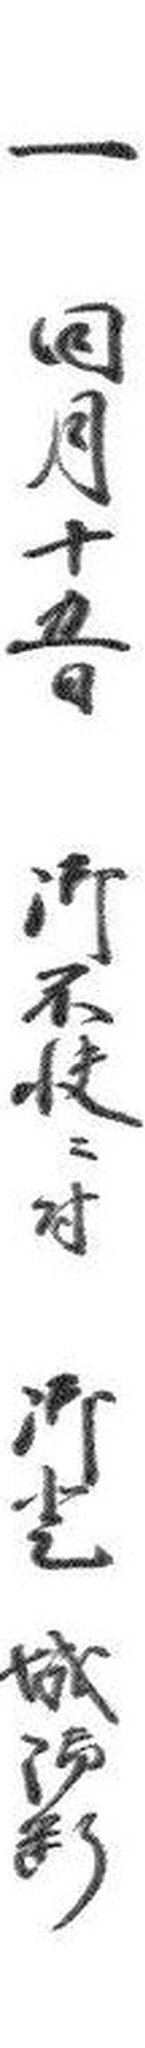一同月十五日御不快ニ付御登城御断
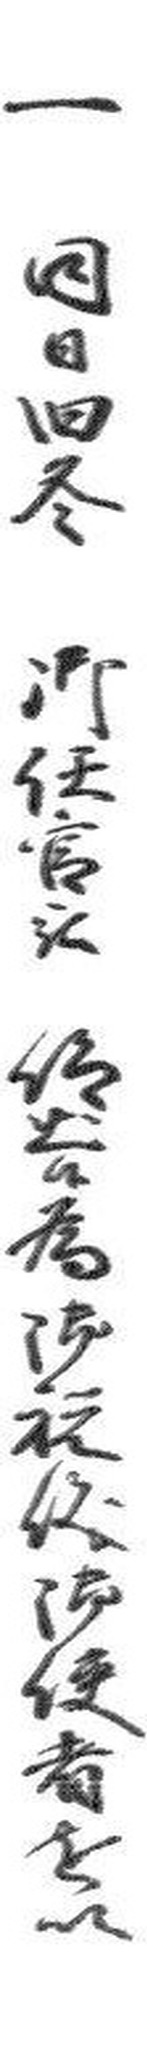一同日旧冬御任官被仰出候為御祝儀御使者を以
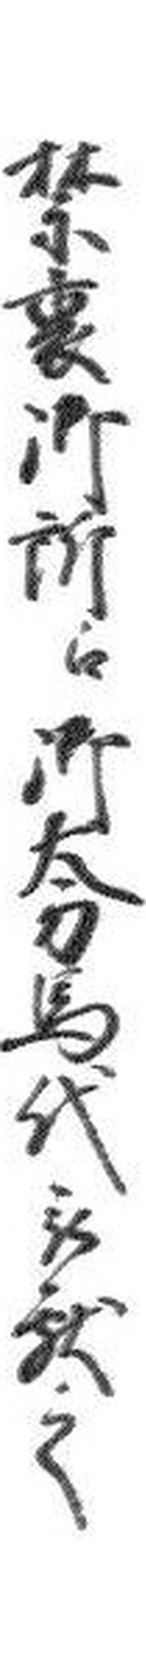禁裏御所江御太刀馬代被献之
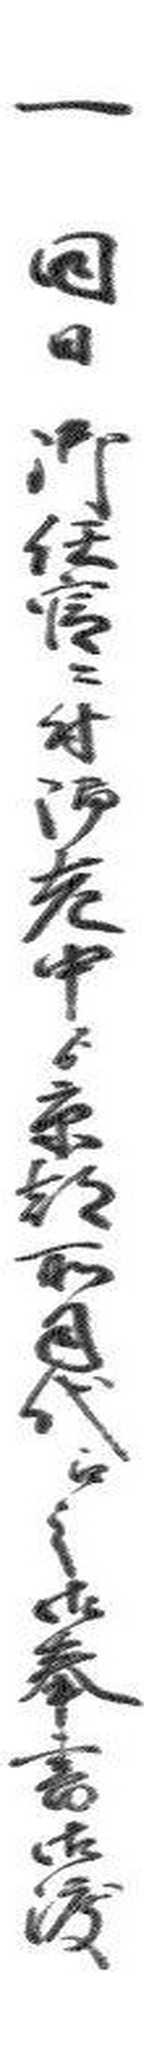一同日御任官ニ付御老中ゟ京都所司代江之御奉書御渡
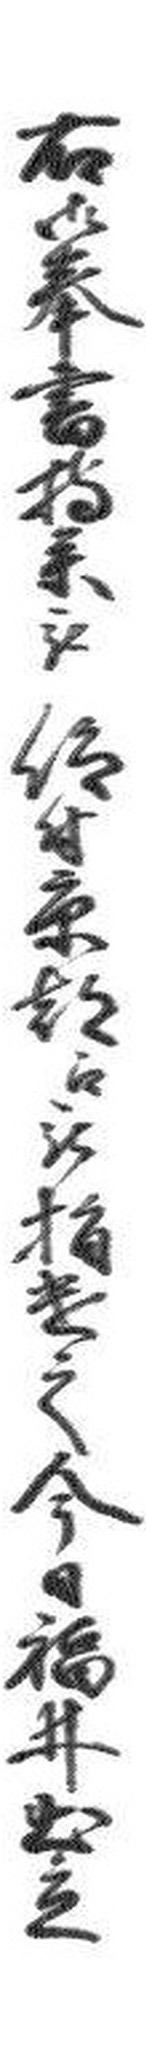右御奉書持参被仰付京都江被指遣之今日福井出立
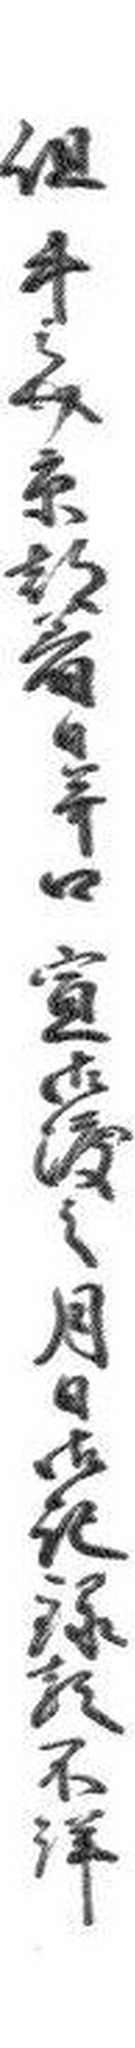但牛之助京都着日幷口宣御渡之月日御記録類不詳
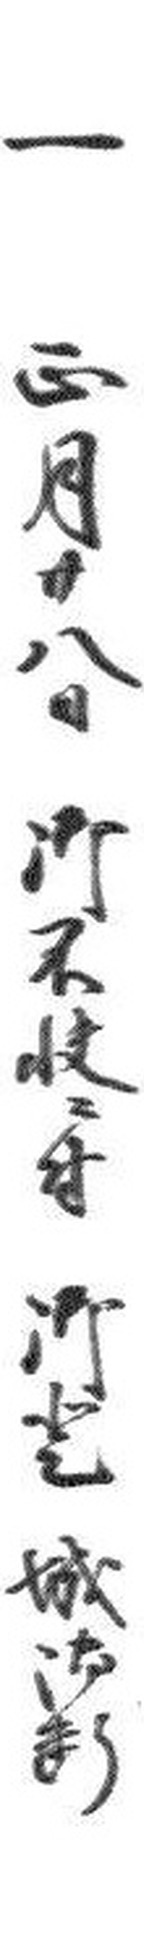一正月廿八日御不快ニ付御登城御断

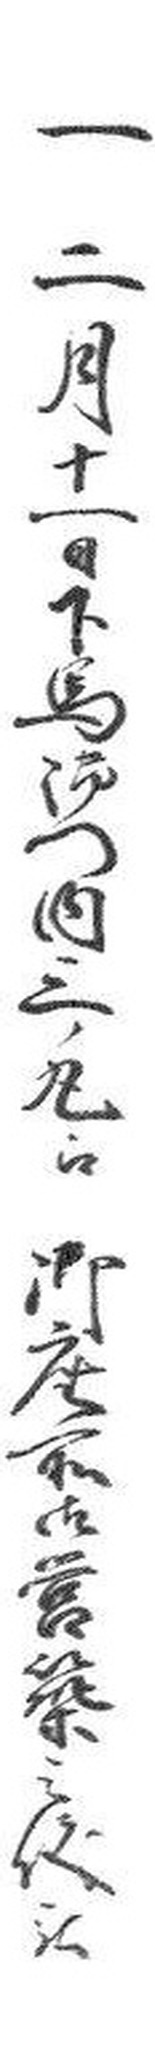一二月十一日下馬御門内三ノ丸江御座所御営築之儀被
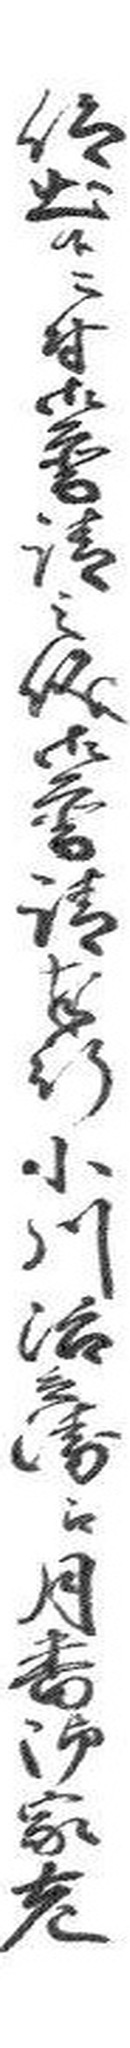仰出候ニ付御普請之儀御普請奉行小川治兵衛江月番御家老
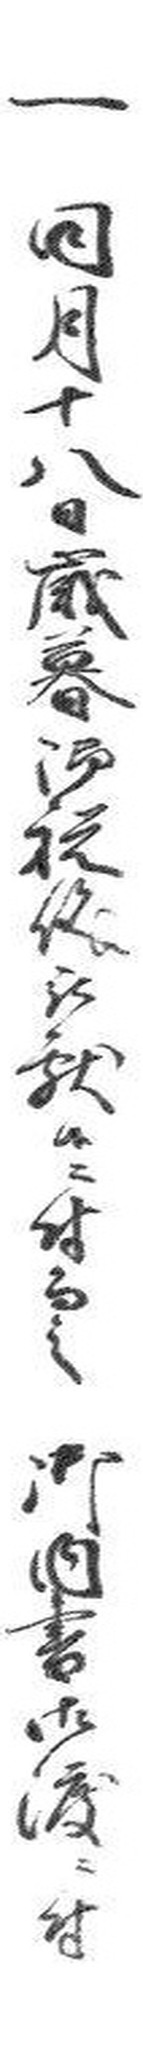一同月十八日歳暮御祝儀被献候ニ付而之御内書御渡ニ付
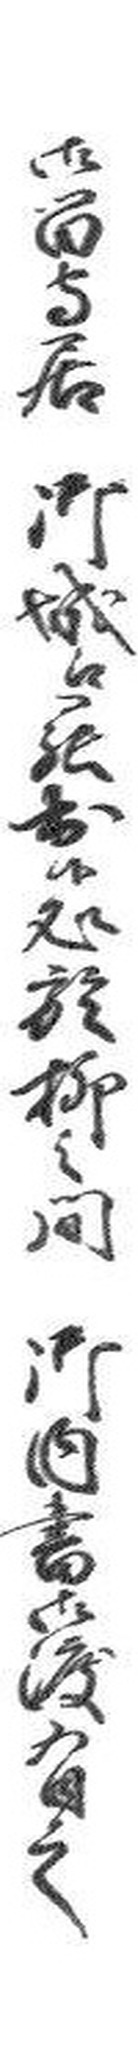御留守居御城江罷出候処於柳之間御内書御渡有之
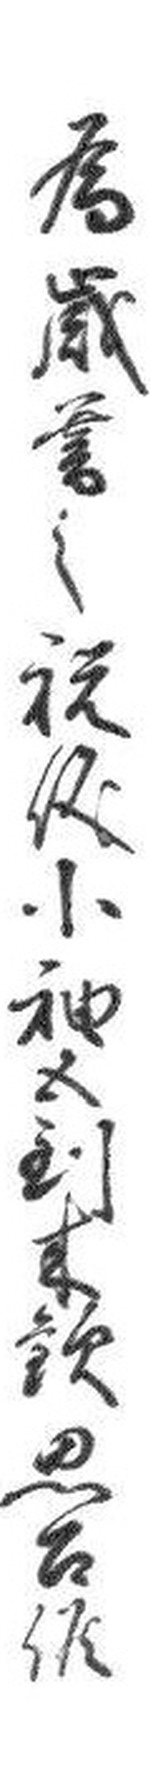為歳暮之祝儀小袖五到来歓思召候
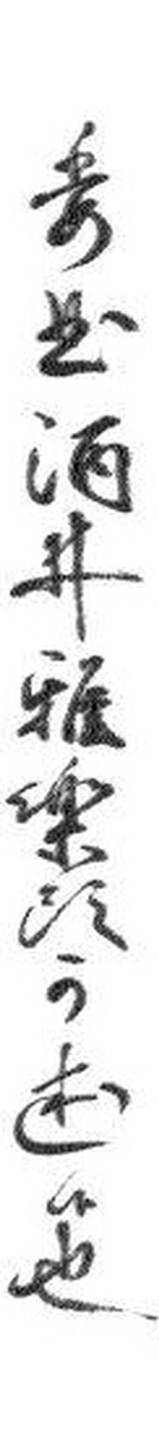委曲酒井雅樂頭可述候也
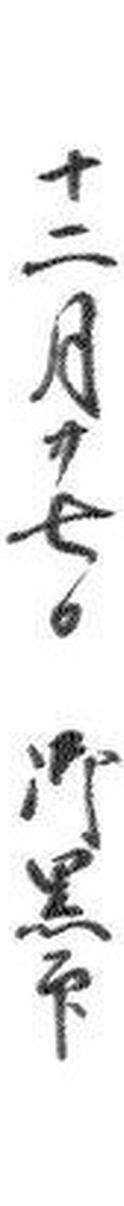十二月廿七日御黒印
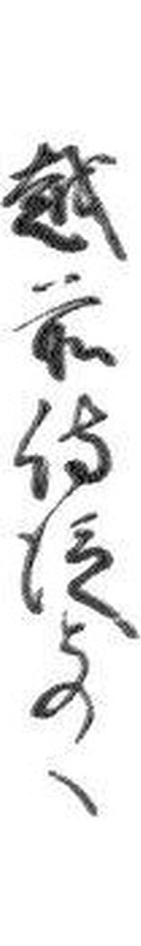越前侍従とのへ
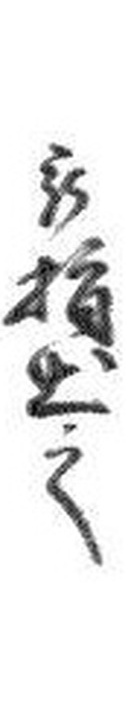被指出之
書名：家譜 十一 昌親公 従延宝二年到延宝四年八月
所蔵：福井県文書館 Fukui Prefectural Archives
